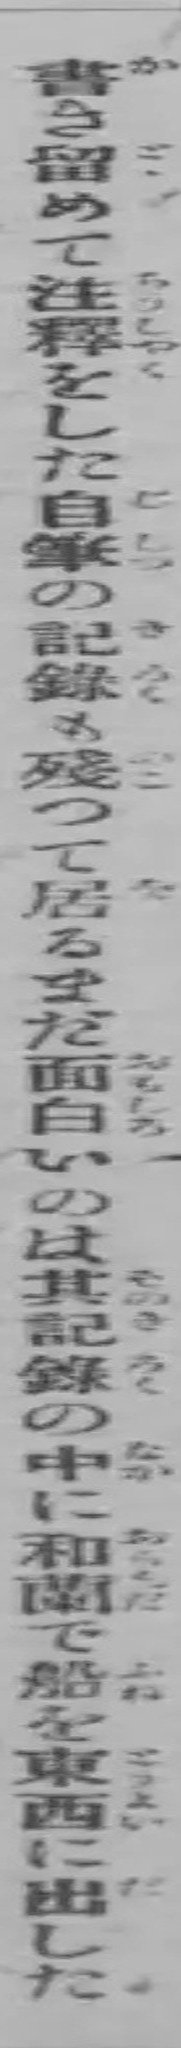書き留めて注釈をした自筆の記録も残つて居るまだ面白いのは其記録の中に和蘭で船を東西に出した
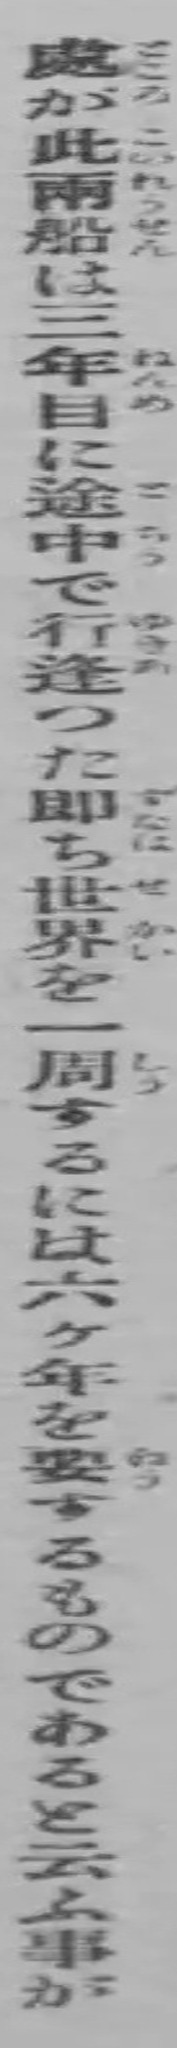処が此両船は三年目に途中で行逢つた即ち世界を一周するには六ヶ年を要するものであると云ふ事が
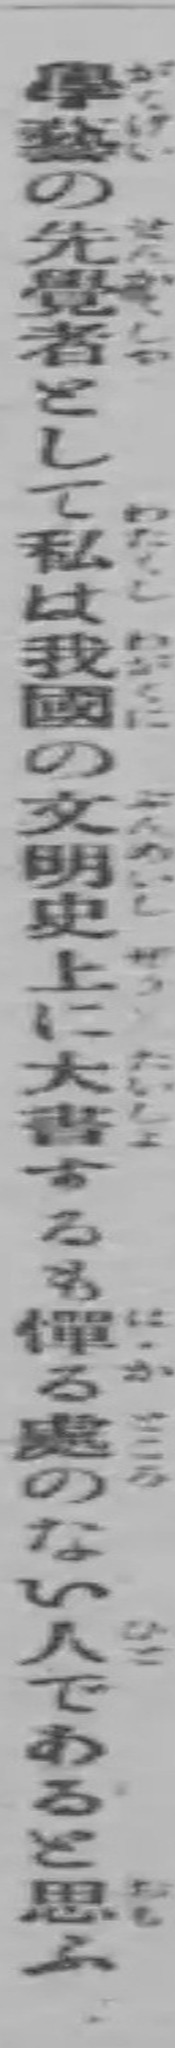学芸の先覚者として私は我国の文明史上に大書するも憚る処のない人であると思ふ
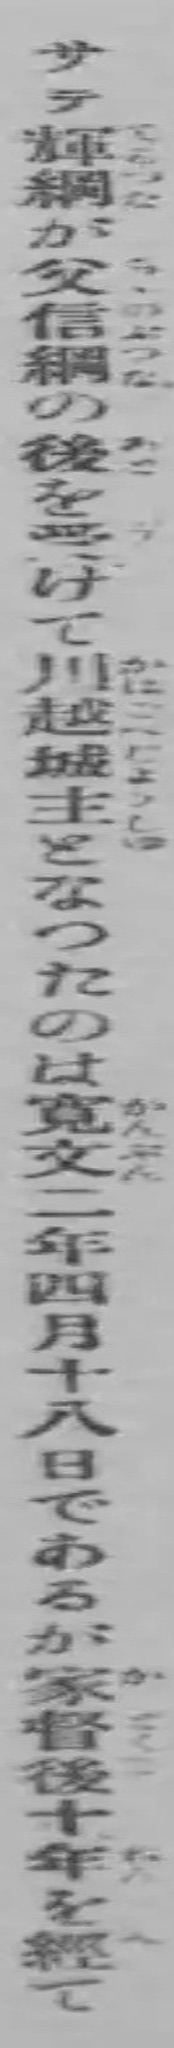サテ輝綱が父信綱の後を受けて川越城主となつたのは寛文二年四月十八日であるが家督後十年を経て
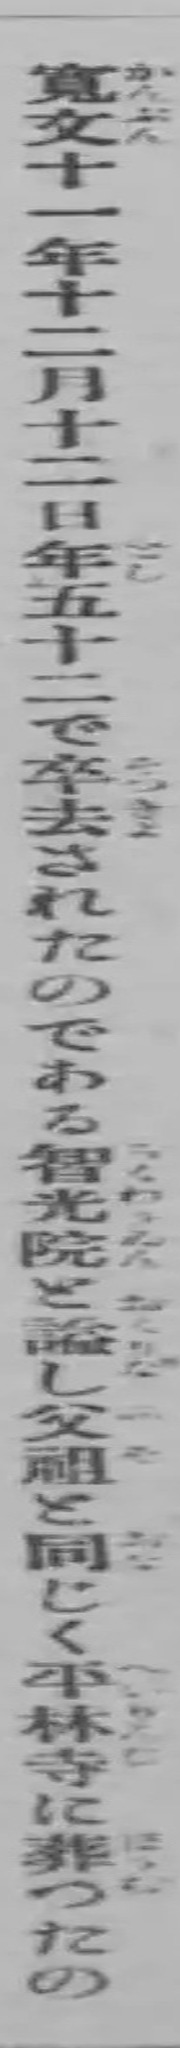寛文十一年十二月十二日年五十二で卒去されたのである智光院と謚し父祖と同じく平林寺に葬つたの
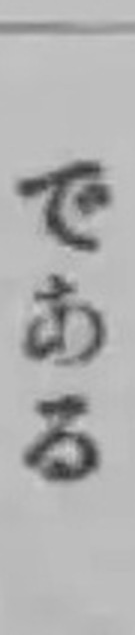である
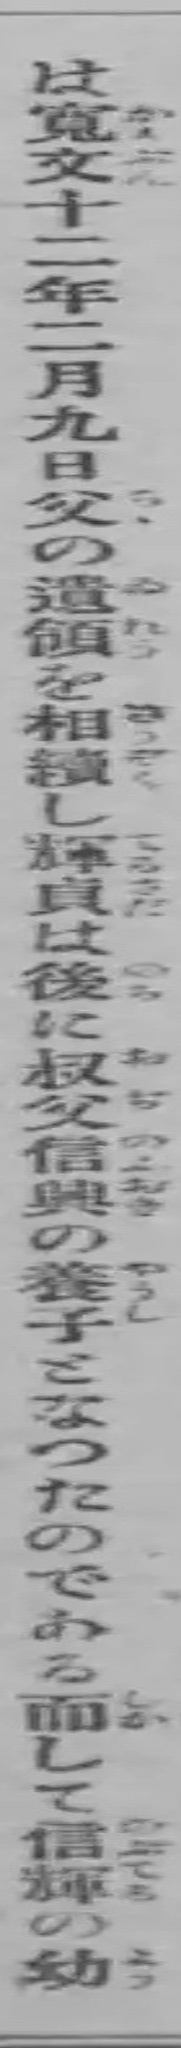は寛文十二年二月九日父の遺領を相続し輝貞は後に叔父信興の養子となつたのである而して信輝の幼
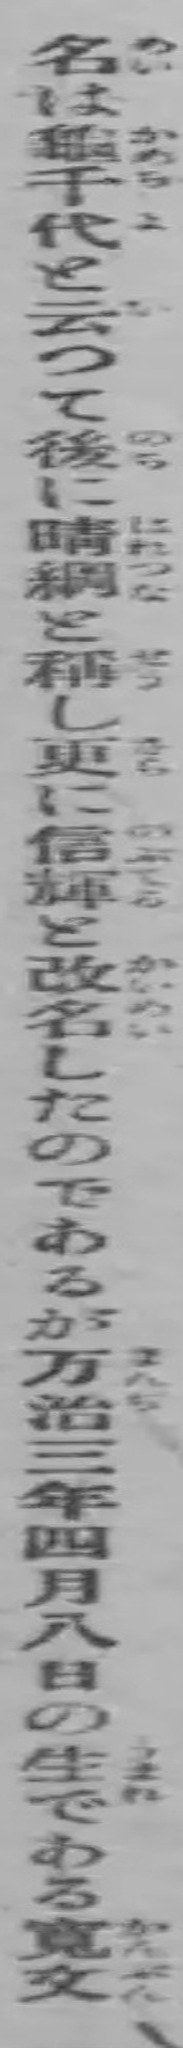大河内輝貞名は亀千代と云つて後に晴綱と称し更に信輝と改名したのであるが万治三年四月八日の生である寛文

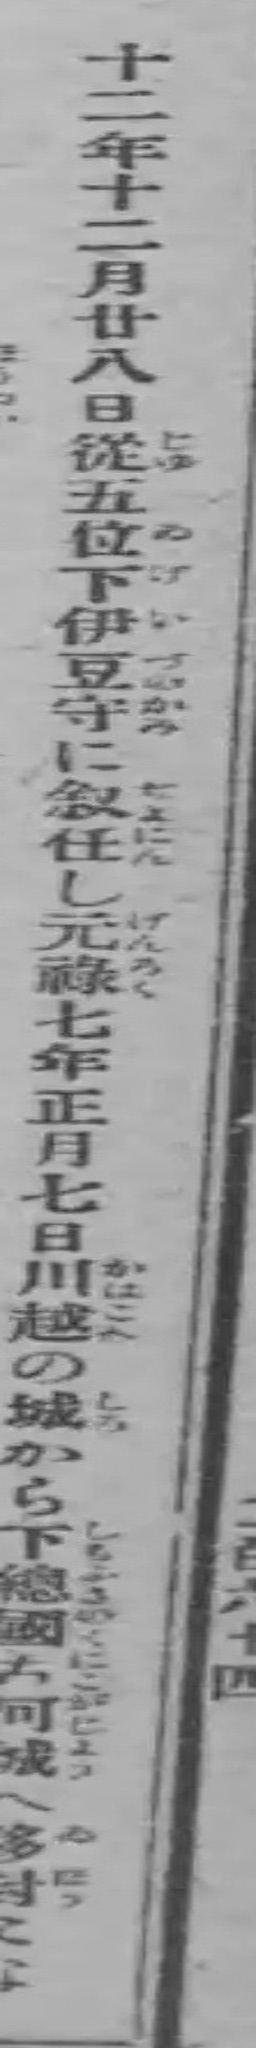十二年十二月廿八日従五位下伊豆守に叙任し元禄七年正月七日川越の城から下総国古河城へ移封にな
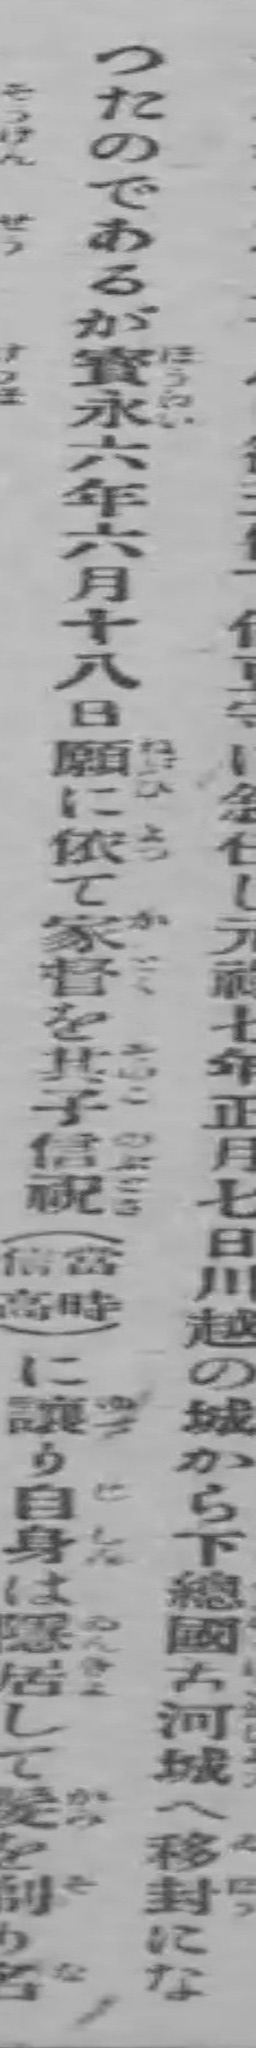つたのであるが宝永六年六月十八日願に依て家督を其子信祝(当時信高)に譲り自身は隠居して髪を剃り名
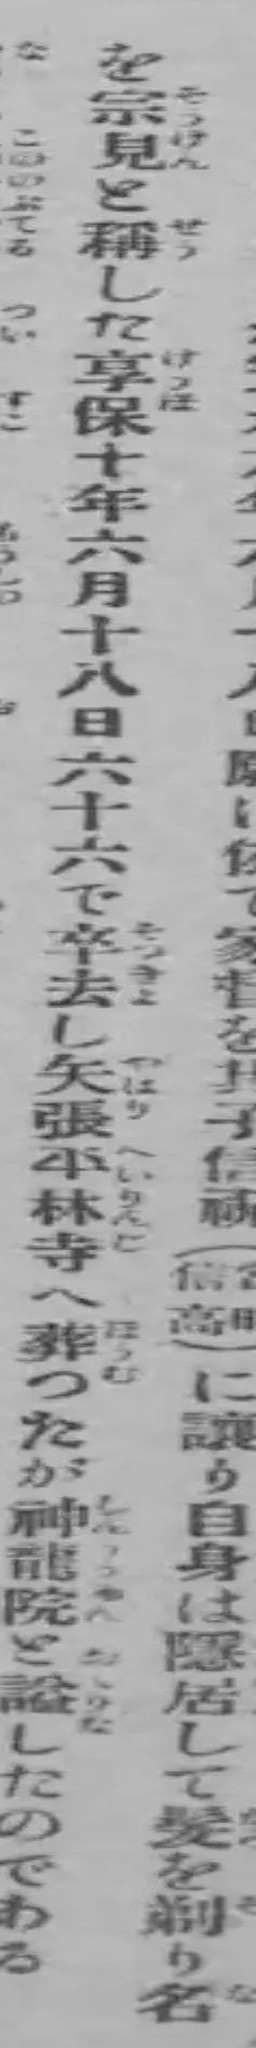を宗見と称した享保十年六月十八日六十六で卒去し矢張平林寺へ葬つたが神龍院と謚したのである
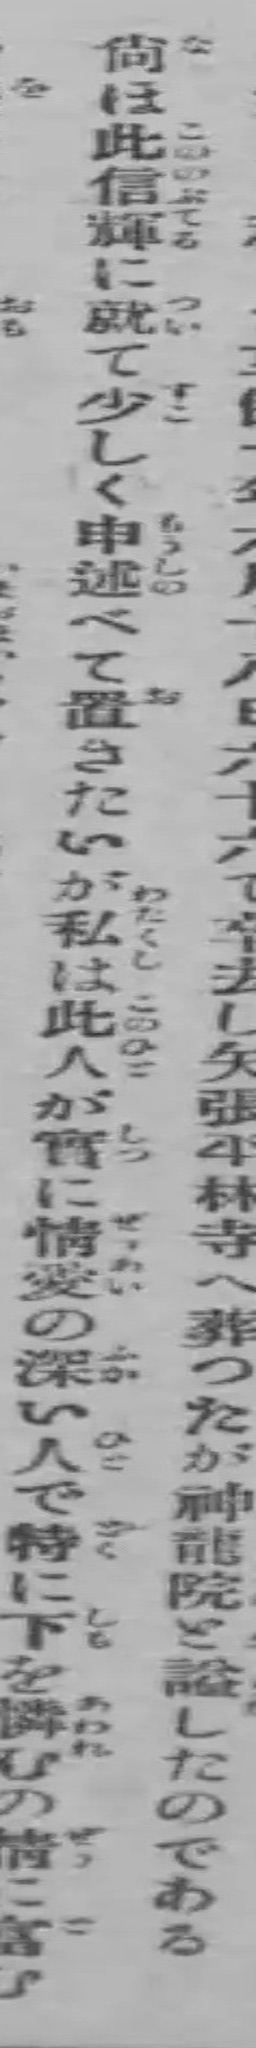信輝の書状尚ほ此信輝に就て少しく申述べて置きたいが私は此人が実に情愛の深い人で特に下を憐むの情に富む
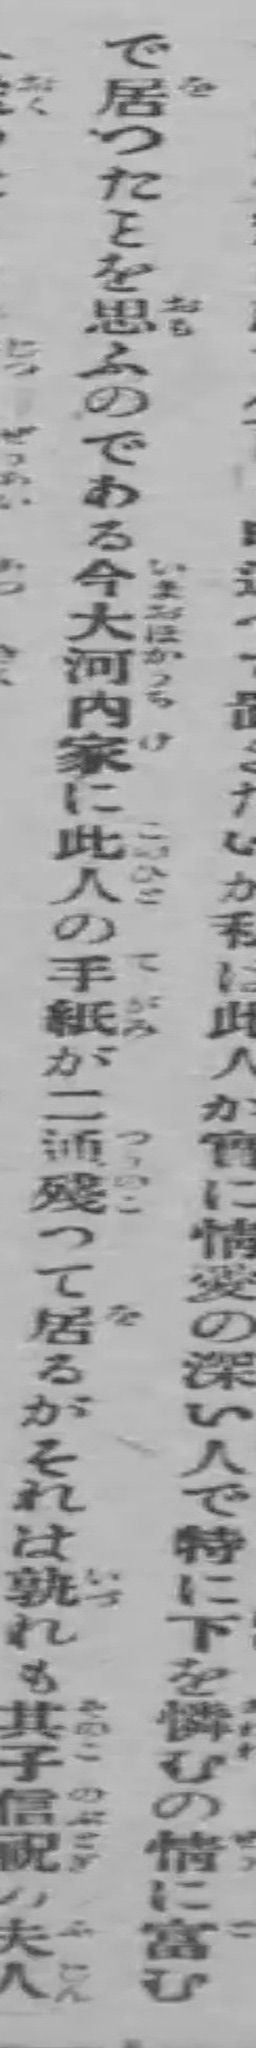於種夫人で居つたことを思ふのである今大河内家に此人の手紙が二通残つて居るがそれは孰れも其子信祝の夫人
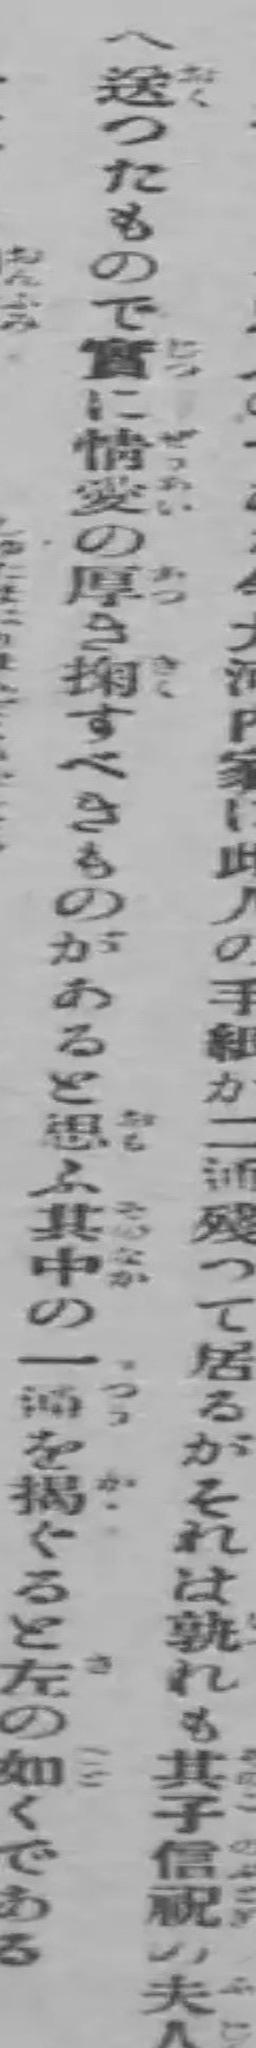へ送つたもので実に情愛の厚き掬すべきものがあると思ふ其中の一通を掲ぐると左の如くである
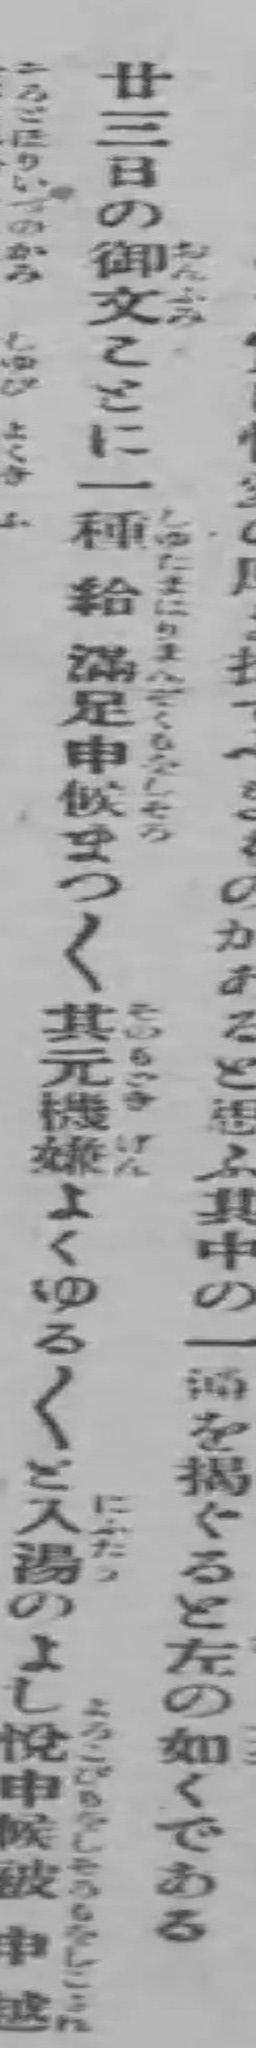廿三日の御文ことに一種給満足申候まつ〳〵其元機嫌よくゆる〳〵と入湯のよし悦申候被申越
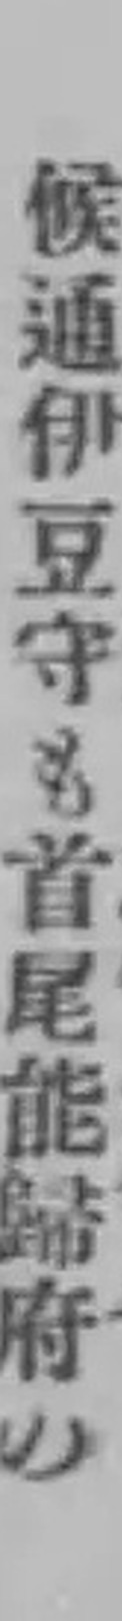候通伊豆守も首尾能帰府の
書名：豊橋市史談
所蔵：国立国会図書館 National Diet Library, JAPAN
